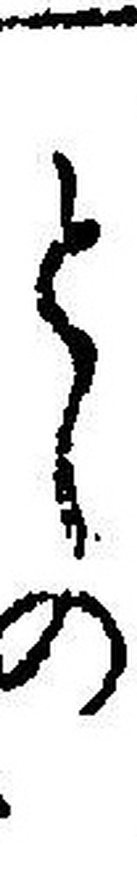としの
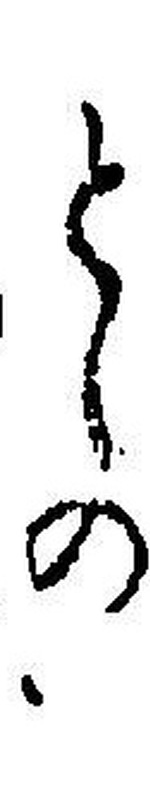としの
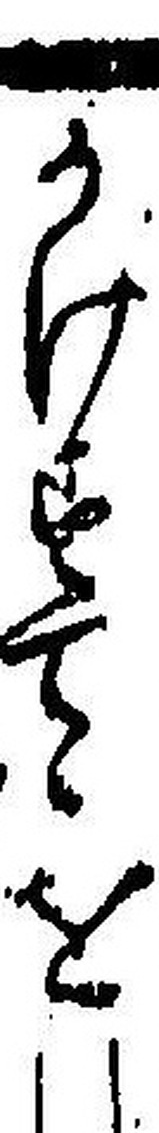かけすてを
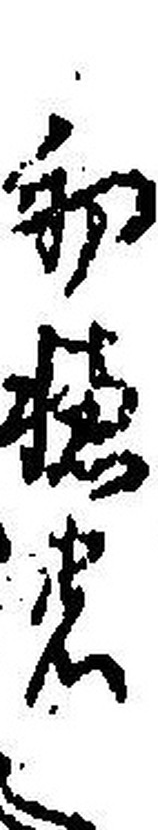初穂の
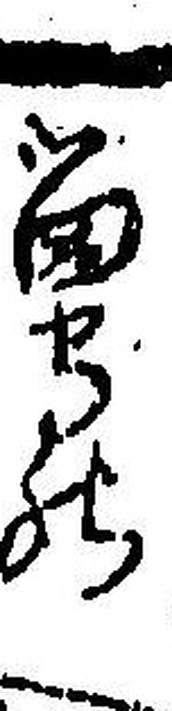留守の
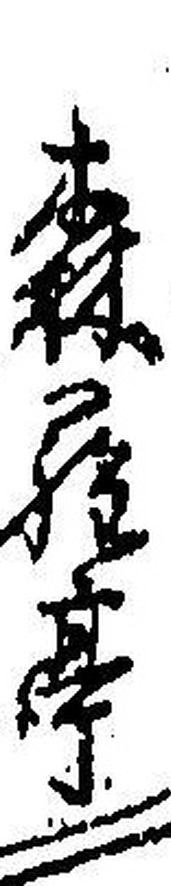森羅亭
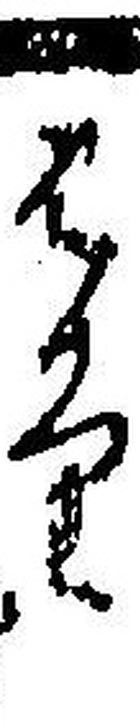はかり
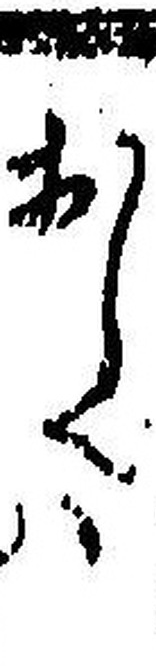おしへは
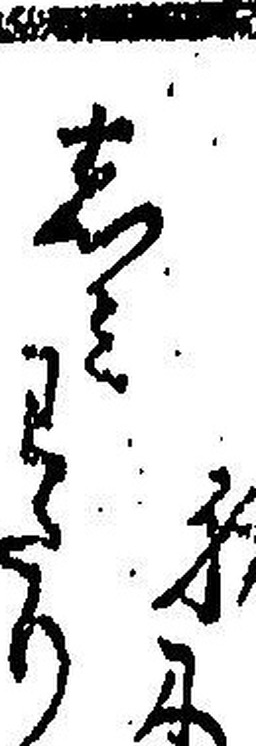しみわたり
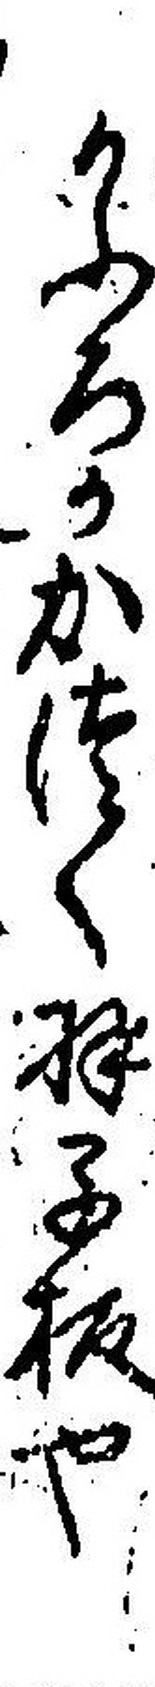かふろかかつく羽子板や
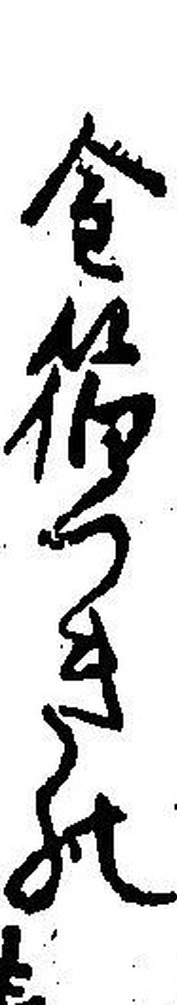金箔つきの
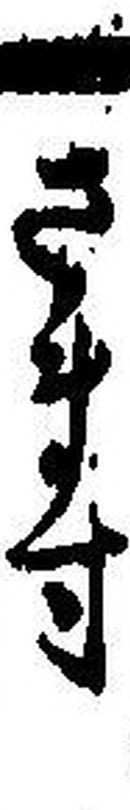さます
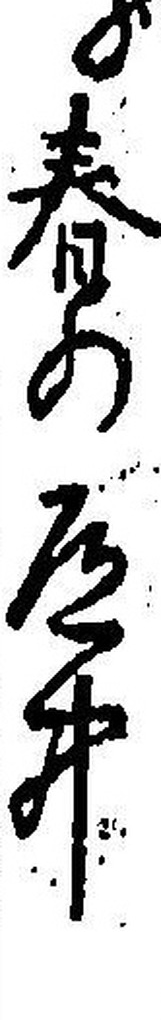春の道中
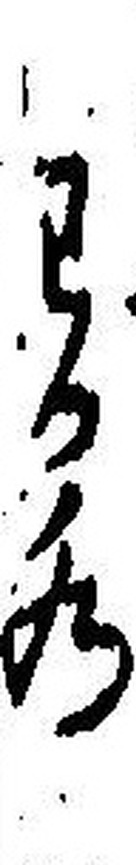わか水
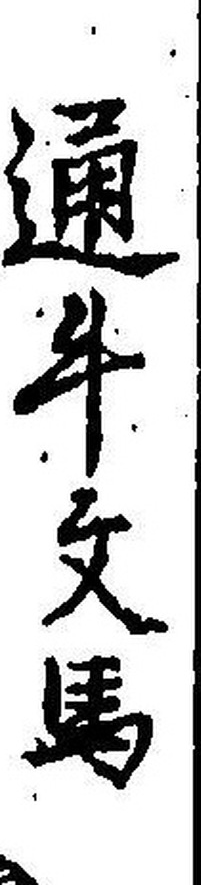通牛文馬
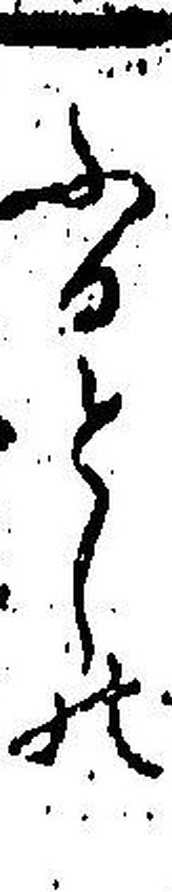ふるとしの
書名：どうれ百人一首 / 鹿都部真顔(狂歌堂)編
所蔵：東京大学総合図書館 General Library in the University of Tokyo, JAPAN
